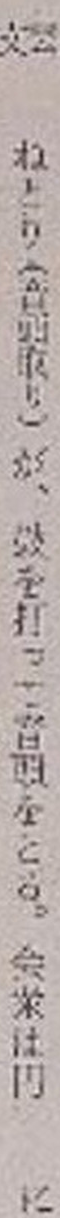ねとり(音頭取り)が、鼓を打って音頭をとる。会衆は円
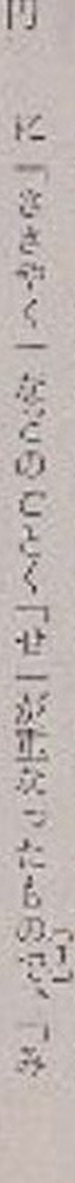に「ささやく」などのごとく「せ」が重なったもので、「み
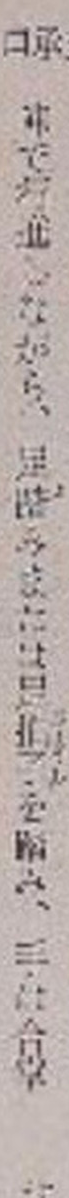陣で行進しながら、足踏みまたは足拍子を踏み、手は合
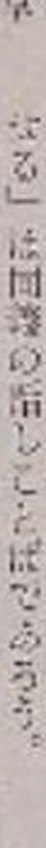せる」は同義の話しことばであろう。
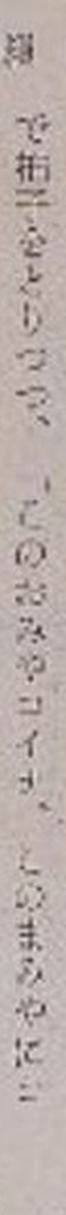で拍子をとりつつ、「このおみやコイナ、このまみやにコ
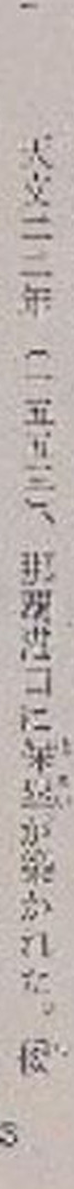天文二二年(一五五三)、那覇港口に保塁が築かれた。倭
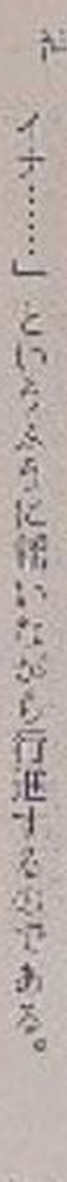イナ……」というふうに謡いながら行進するのである。
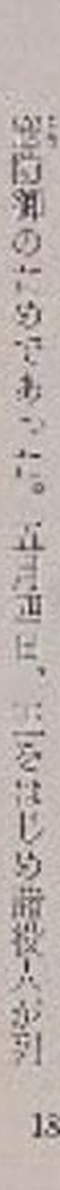寇防御のためであった。五月四日、王をはじめ諸役人が列

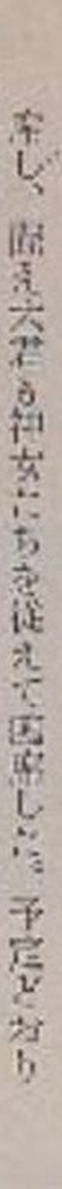し、聞え大君も神女たちを従えて臨席した。予定どおり
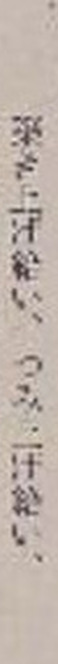築き上げ給い、つみ上げ給い、
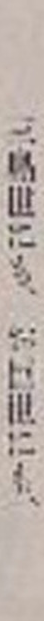三島世にも、お国世にも、
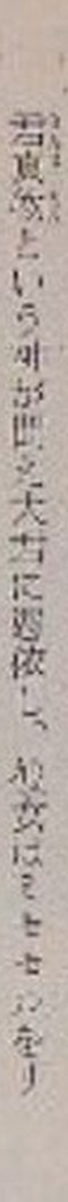君真物という神が聞え大君に憑依し、神女はミセセルをリ
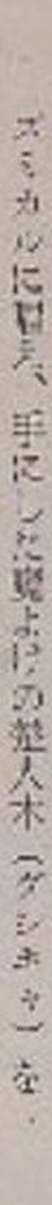ズミカルに唱え、手にした魔よけの楚人木(ダシキャ)を
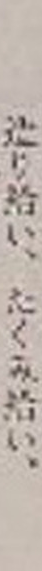造り給い、たくみ給い、
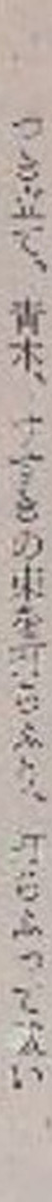つき立て、青木、すすきの束を打ちふり、打ちふって祓い
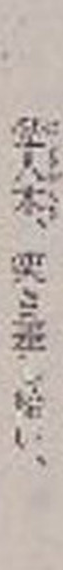楚人木、突き差し給い、
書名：沖縄口承文芸
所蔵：University of the Ryukyus Library
